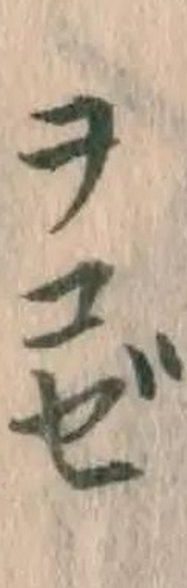ヲコゼ
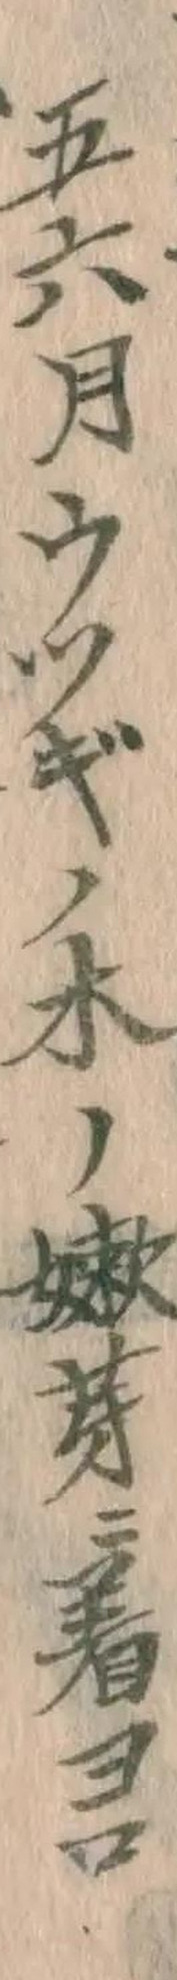五六月ウツギノ木ノ嫩芽ニ着ヨコ
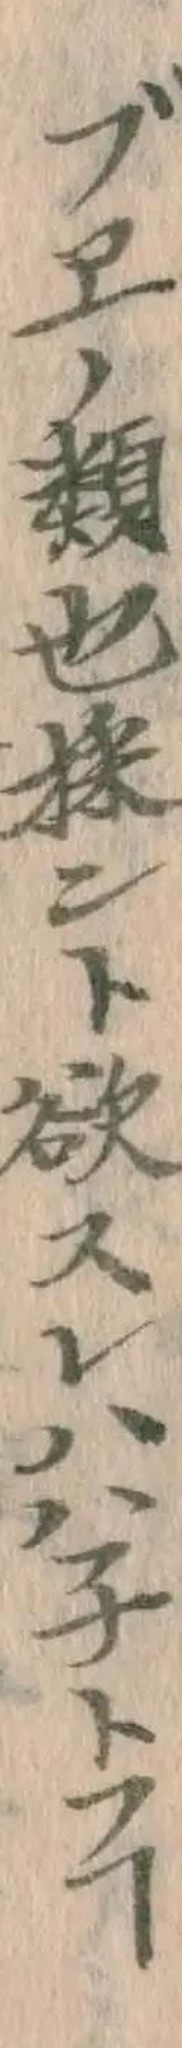ブヱノ類也採ント欲スレハハネトフコト
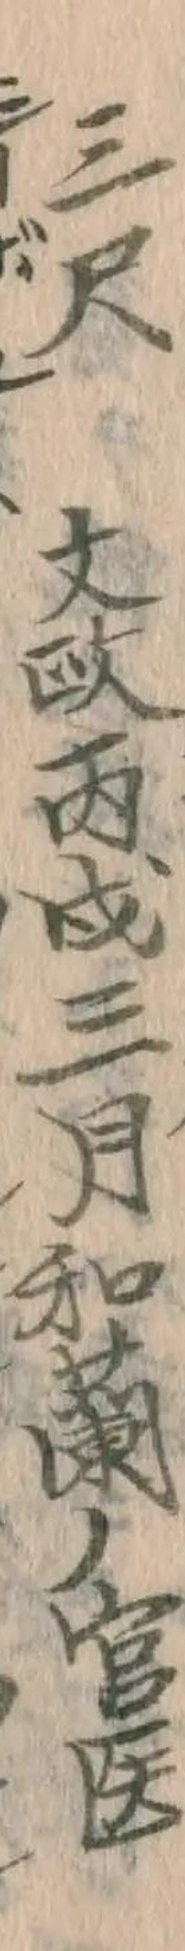三尺文政丙戌三月和蘭ノ官医
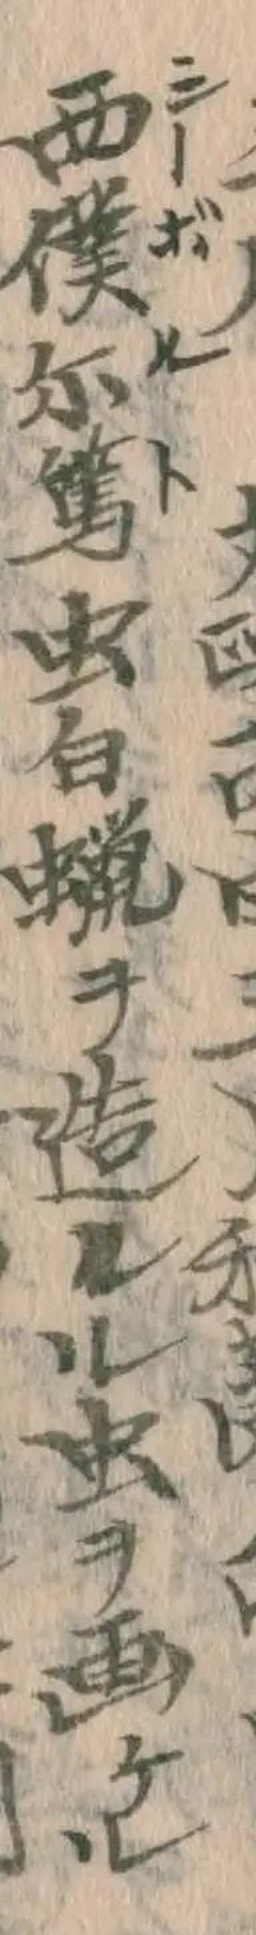西僕尓篤虫白蝋ヲ造＃ル虫ヲ画ケル
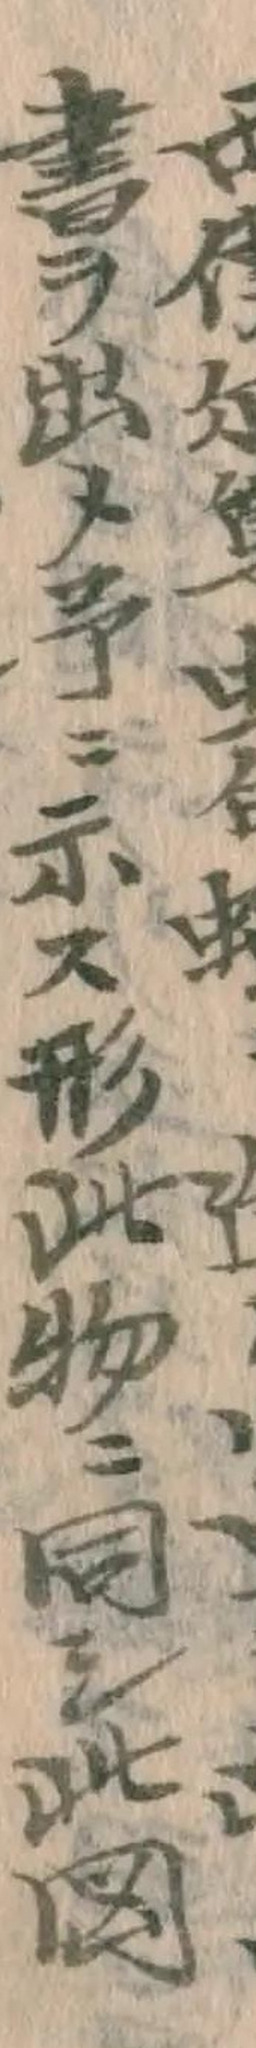書ヲ出シテ予ニ示ス形此物ニ同シ此図
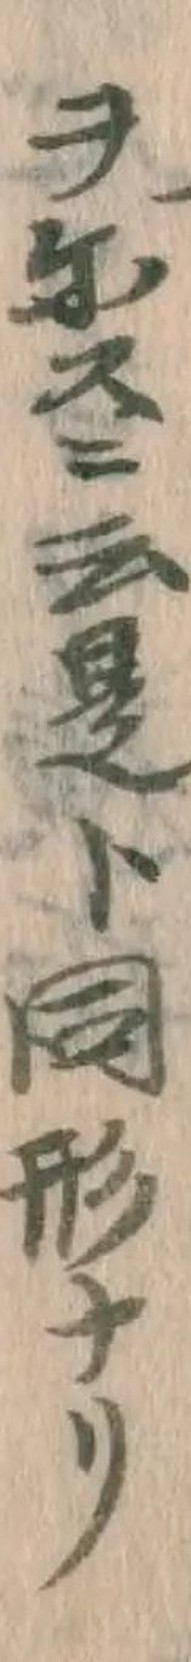ヲ尓スニ云是ト同形ナリ
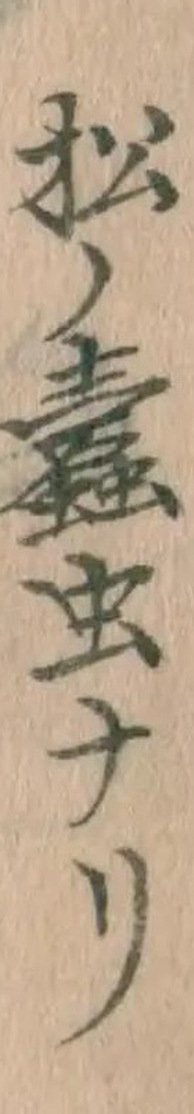松ノ蠹虫ナリ
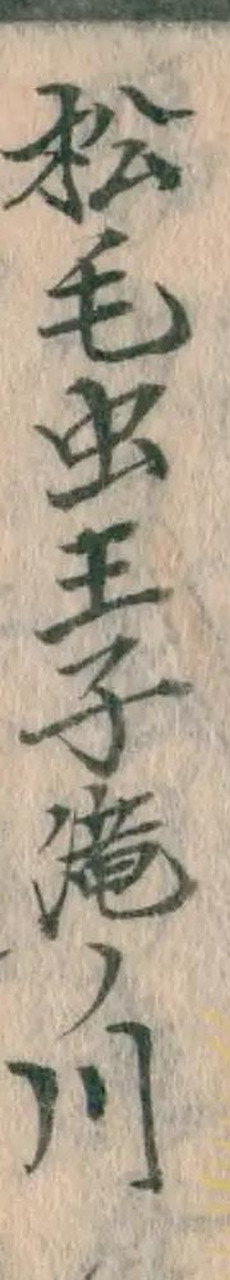松毛虫王子滝ノ川
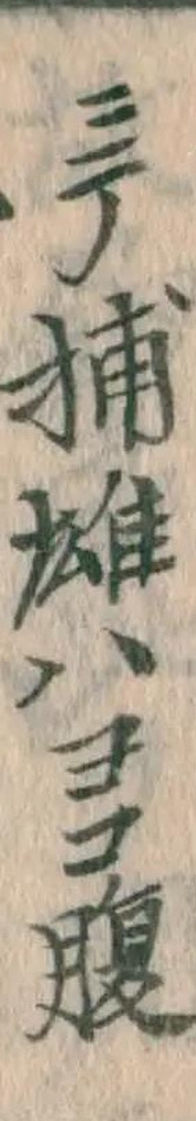ニテ捕雄ハヨコ腹
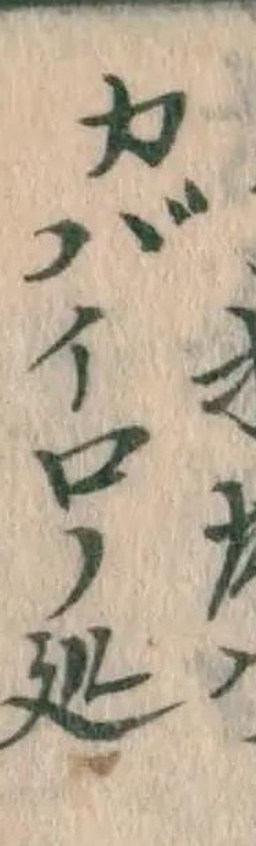カバイロノ処
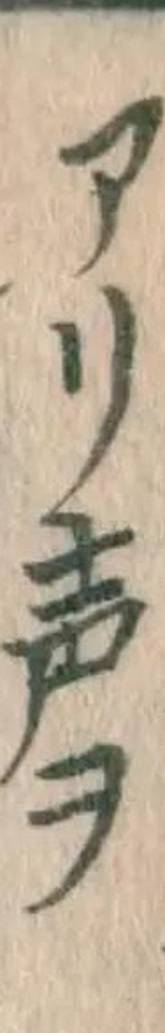アリ声ヲ
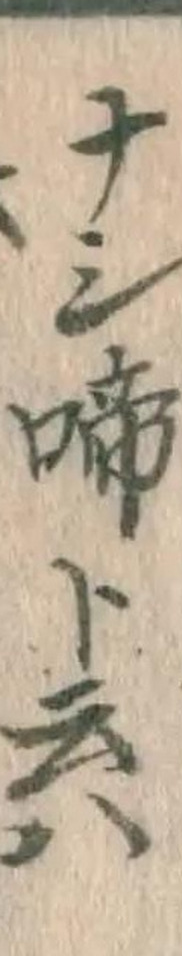ナシ啼ト云ハ
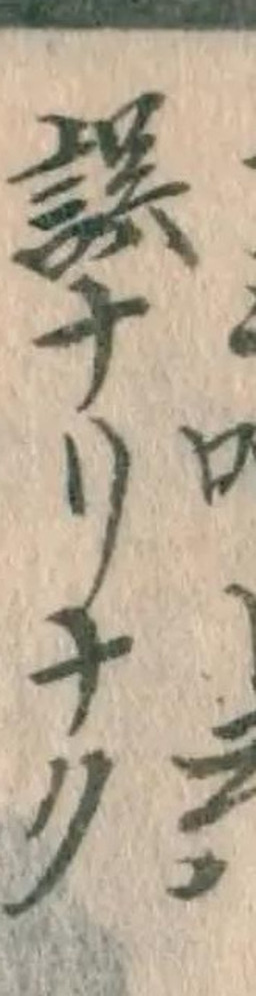誤ナリナク
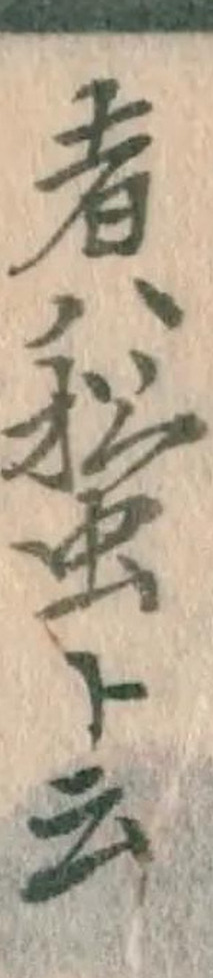者ハ松虫ト云
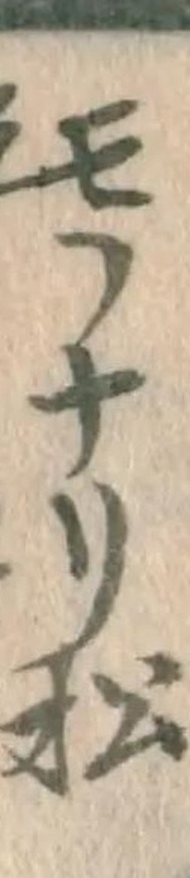モノナリ松
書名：千蟲譜 3巻. [3]
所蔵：国立国会図書館 National Diet Library, JAPAN
